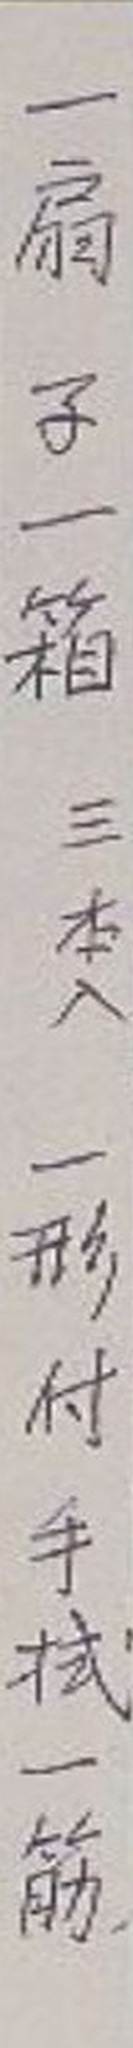一扇子一箱三本入一形付手拭一筋

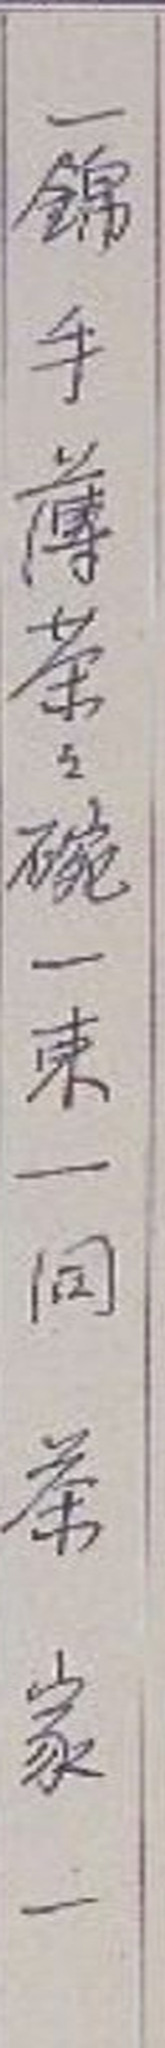一錦手薄茶々碗一束一同茶家一
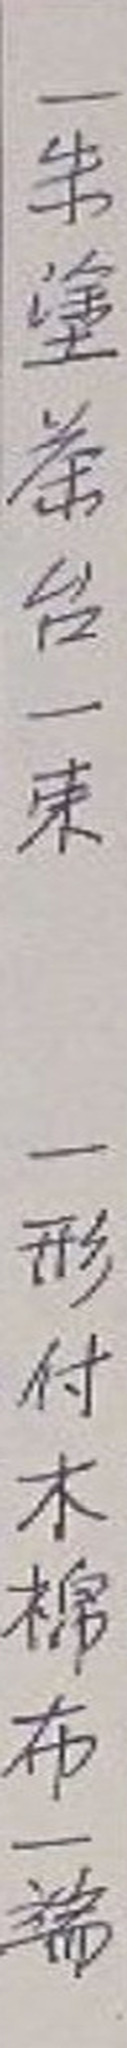一朱塗茶台一束一形付木棉布一端
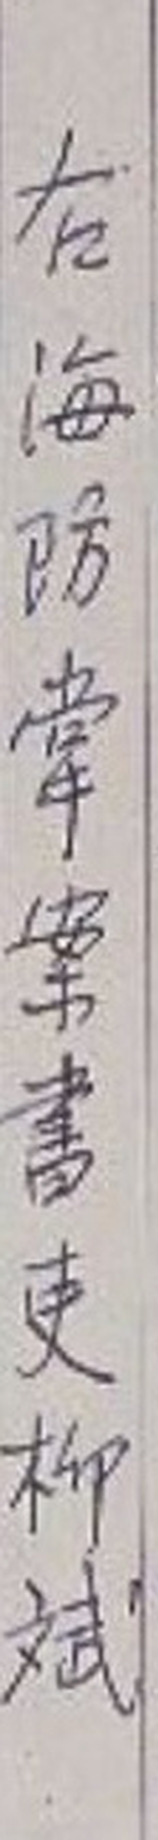右海防掌案書吏柳斌
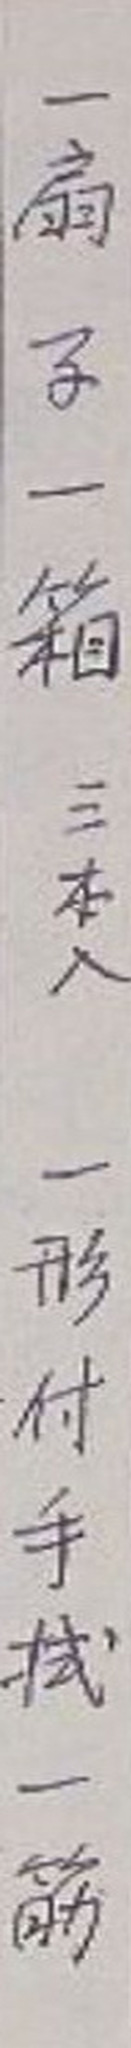一扇子一箱三本入一形付手拭一筋
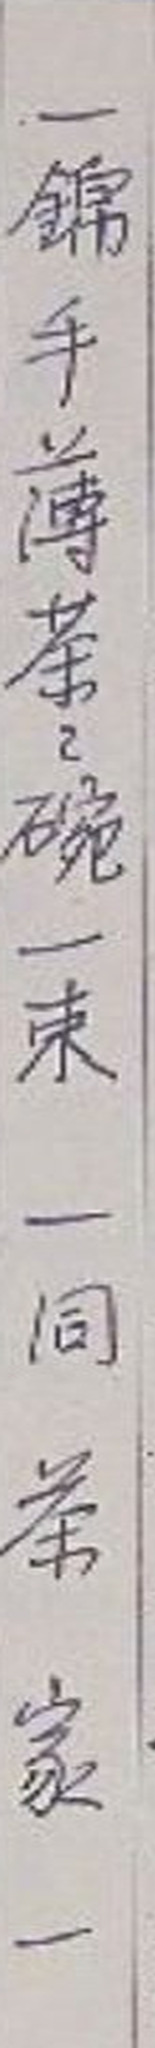一錦手薄茶々碗一束一同茶家一
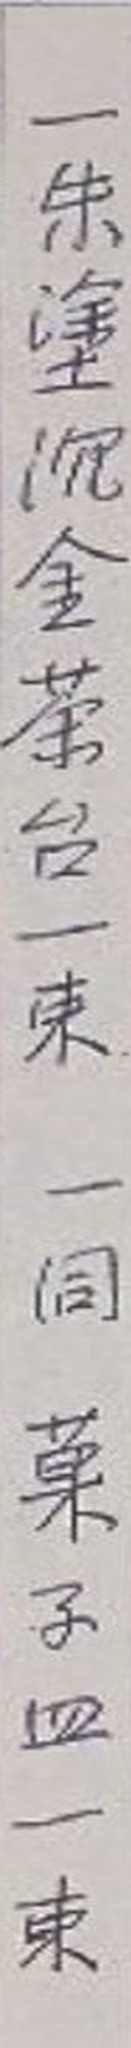一朱塗沈金茶台一束一同菓子皿一束
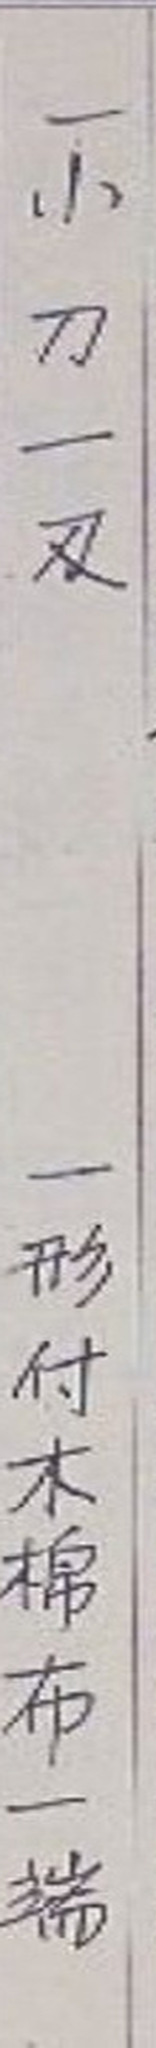一小刀一刃一形付木棉布一端
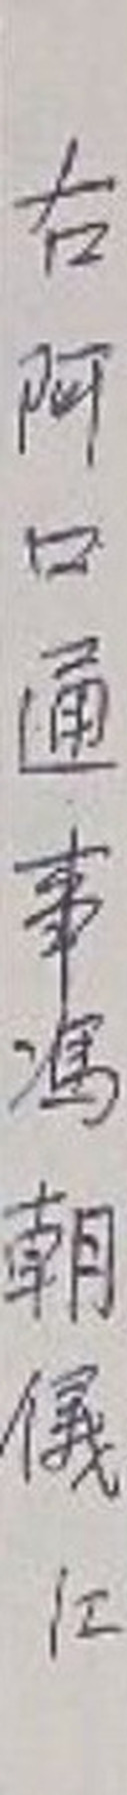右阿口通事馮朝儀え
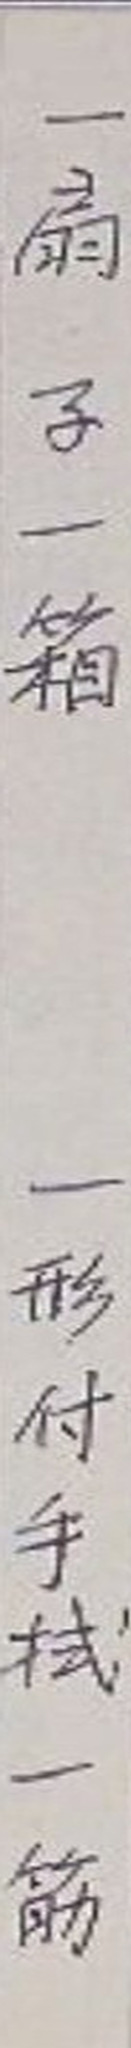一扇子一箱一形付手拭布一端
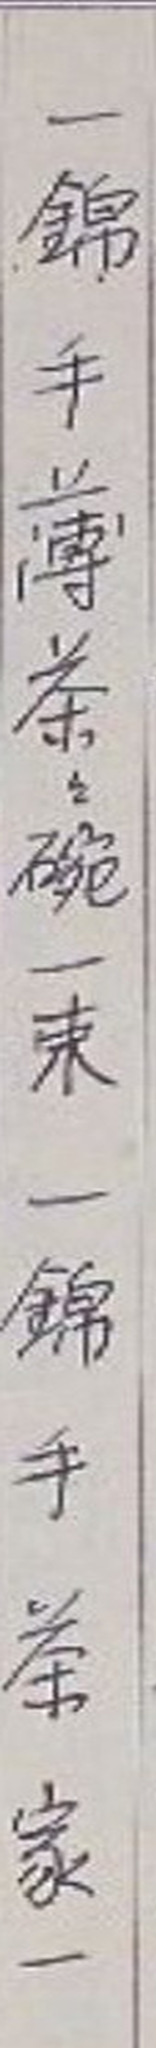一錦手薄茶々碗一束一同茶家一
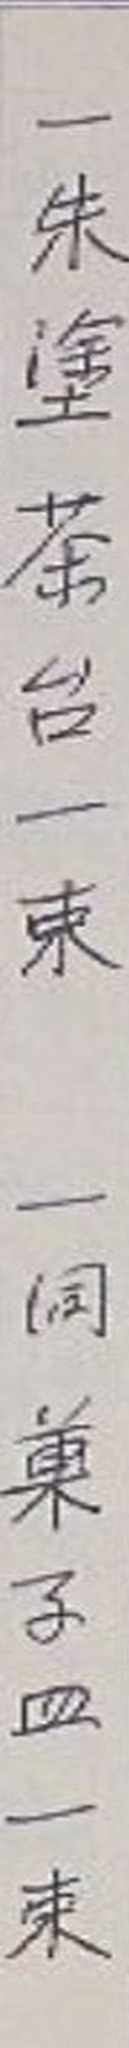一朱塗茶台一束一同菓子皿一束
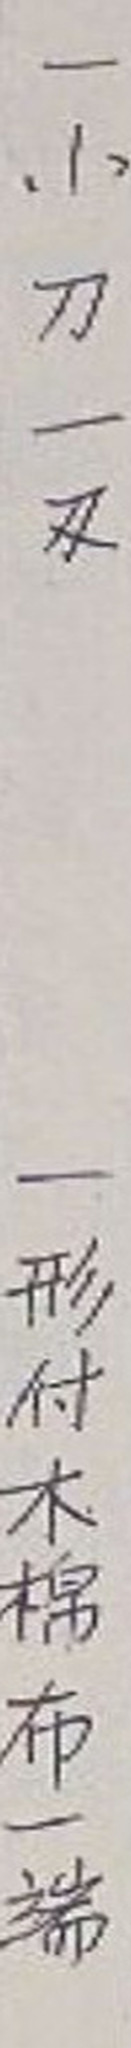一小刀一刃一形付木棉布一端
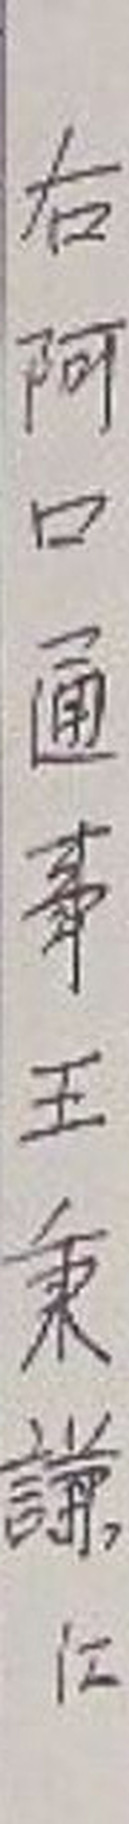右阿口通事王秉謙え
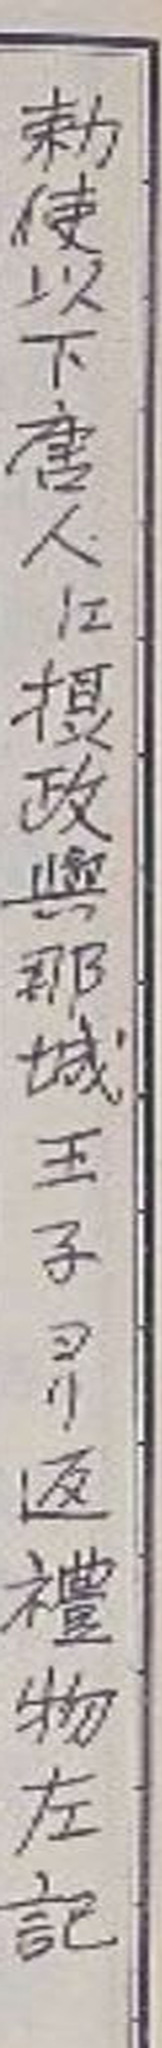勅使以下唐人え摂政与那城王子より返礼物左記
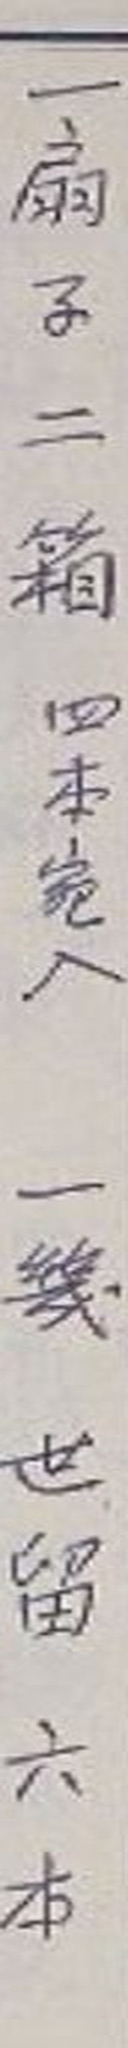一扇子二箱四本宛入一幾世留六本
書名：支那冊封使来琉諸記 下巻
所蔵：University of the Ryukyus Library
